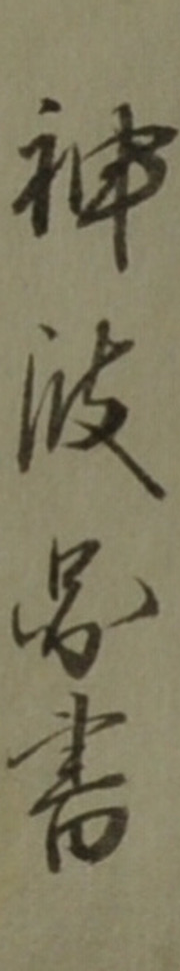神波図書
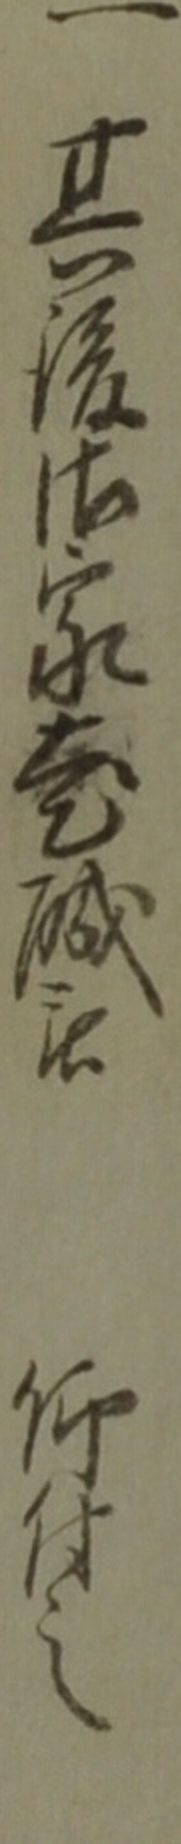一其後御家老職被仰付之
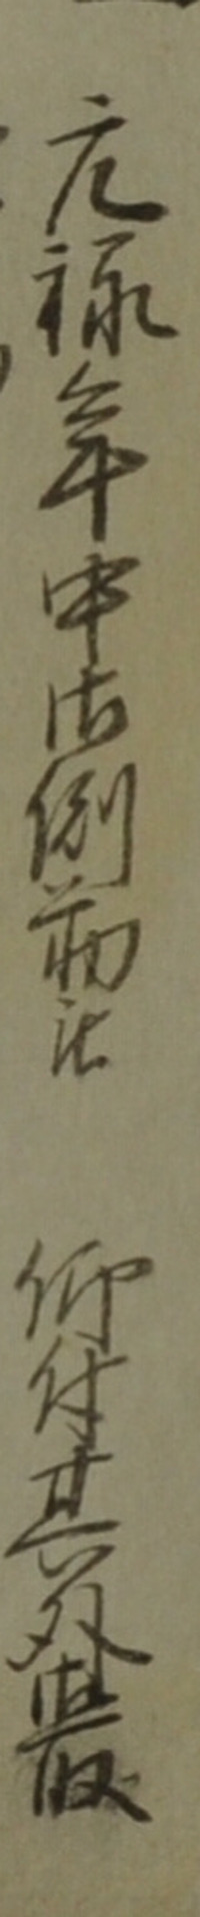一元禄年中御側勤被仰付其外御取
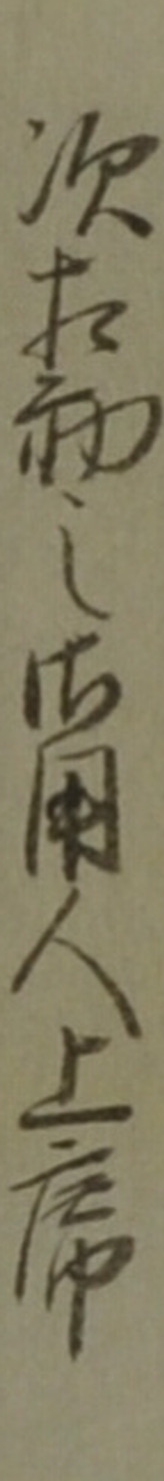次相勤之御用人上席
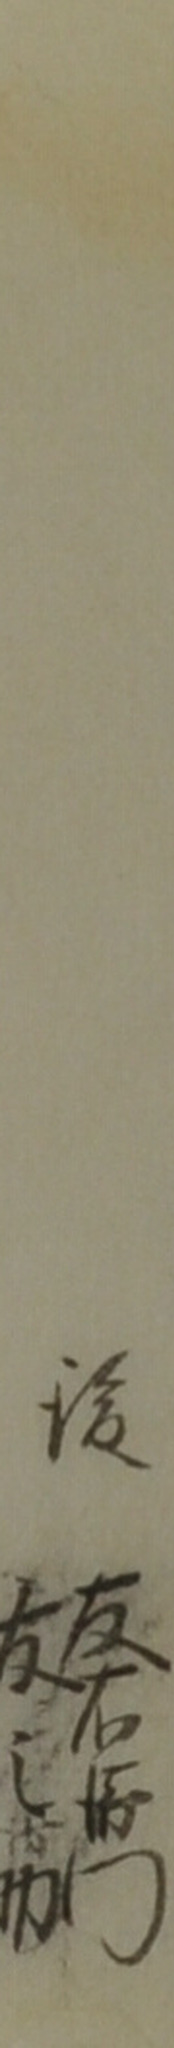後友右衛門
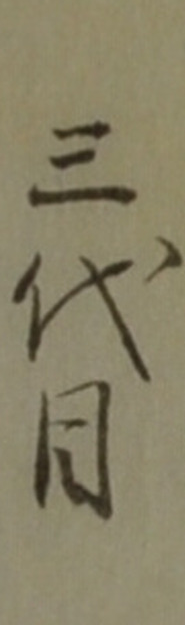三代目
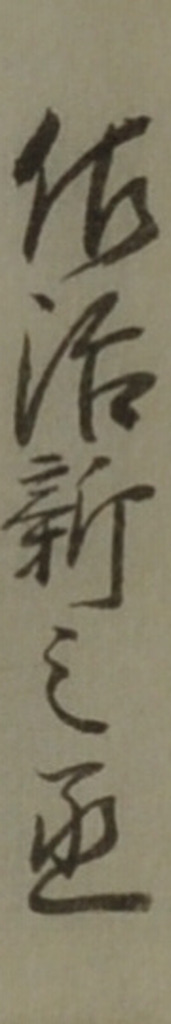佐治新之丞
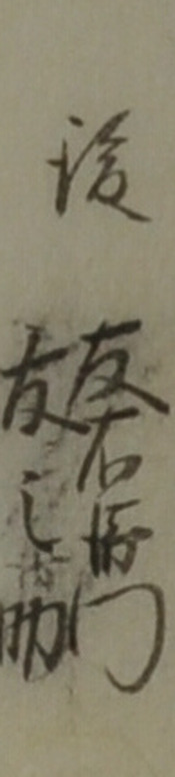後友右衛門
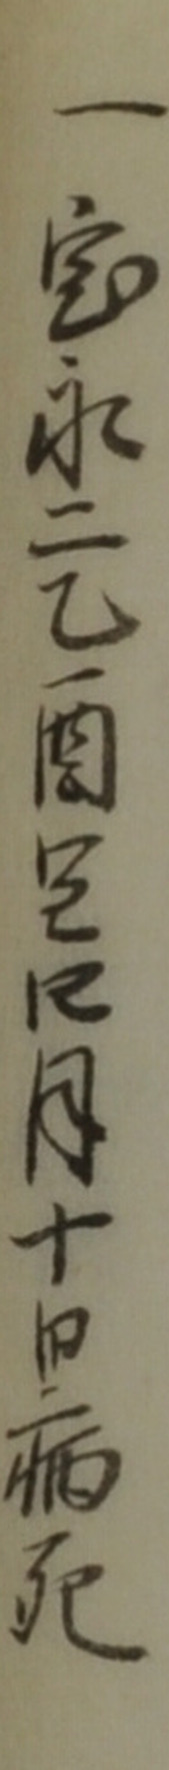一宝永二乙酉閏四月十日病死
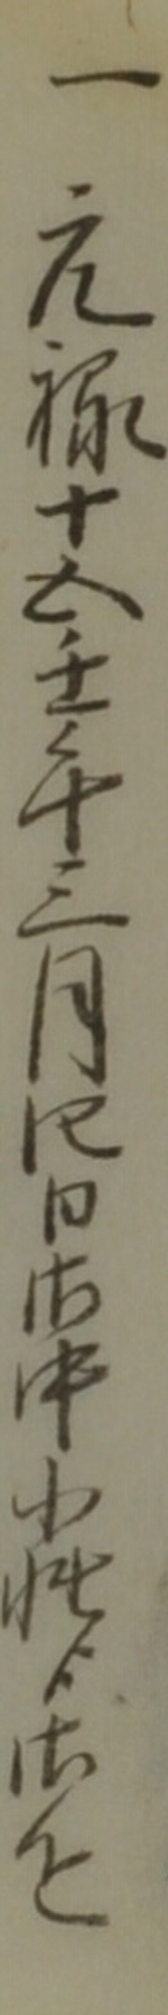一元禄十五壬午三月四日御中小性ゟ御近
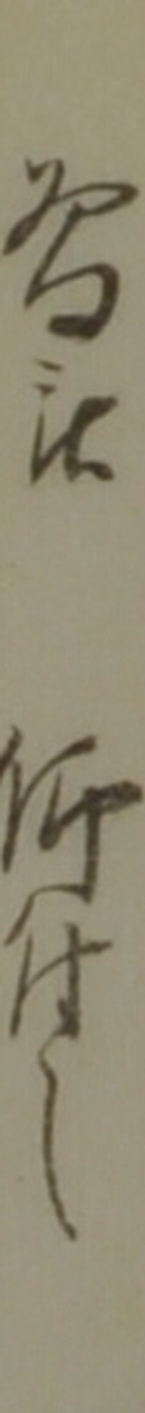習被仰付之
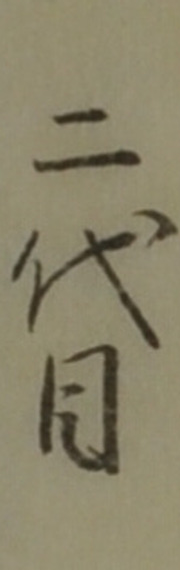二代目
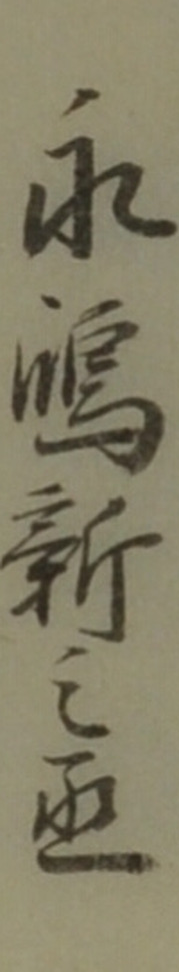永嶋新之丞
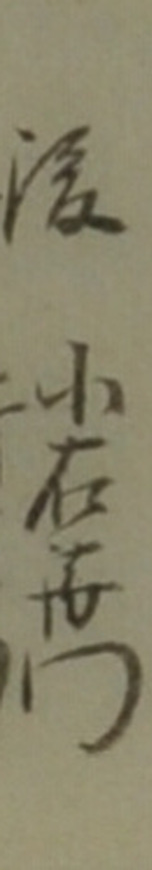後小右衛門
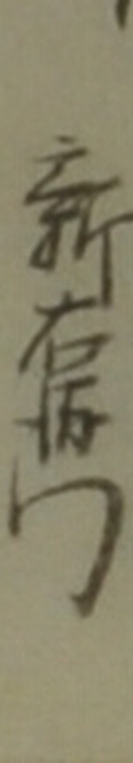新右衛門
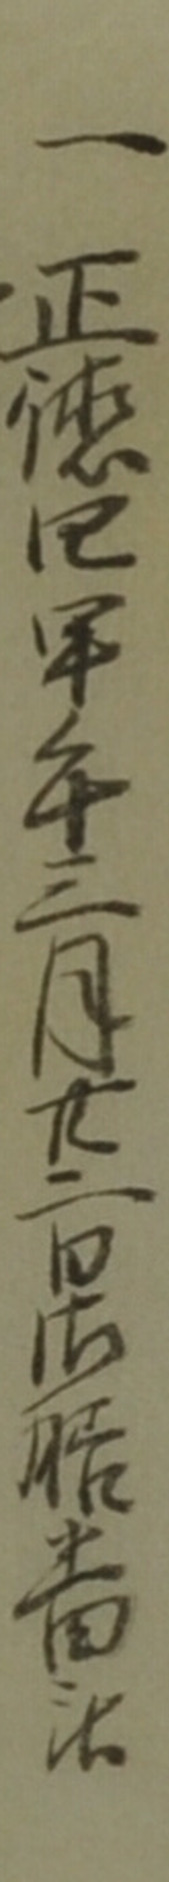一正徳四甲午三月廿二日御膳番被
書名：諸御役代々録（五）
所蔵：伊那市立高遠町図書館・合同会社AMANE
